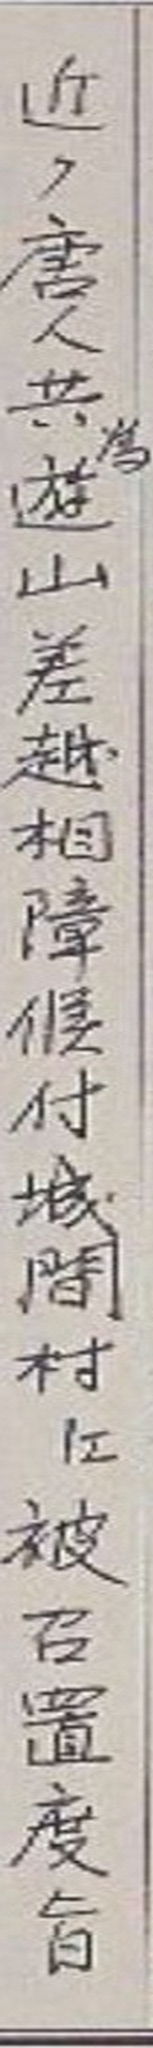近く唐人共為遊山差越相障候付城間村え被召置度旨
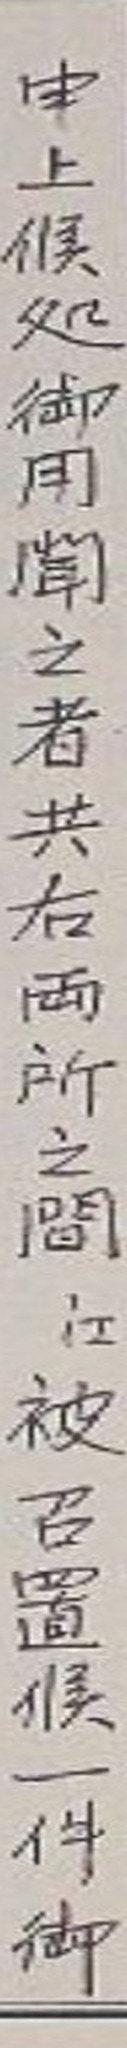申上候処御用聞之者共右両所之間え被召置候一件御
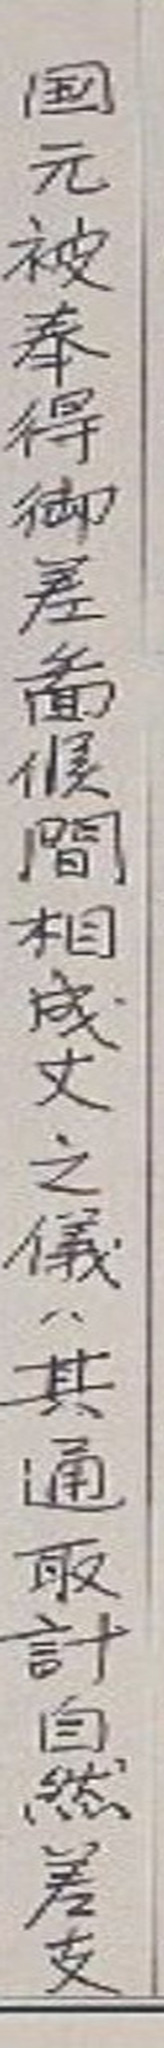国元被奉得御差図候間相成丈之儀は其通取計自然差支
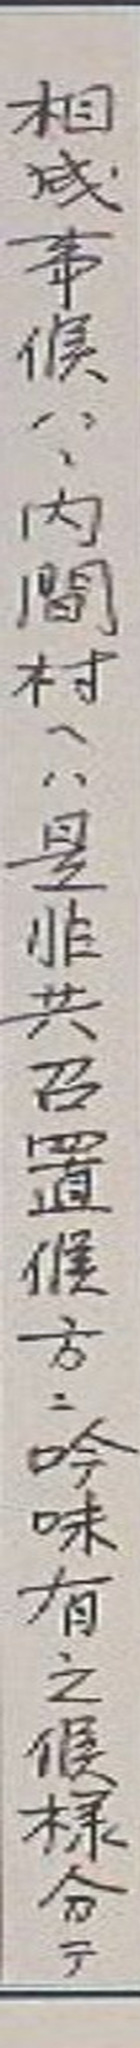相成事候はゝ内間村へは是非共召置候方に吟味有之候様分て
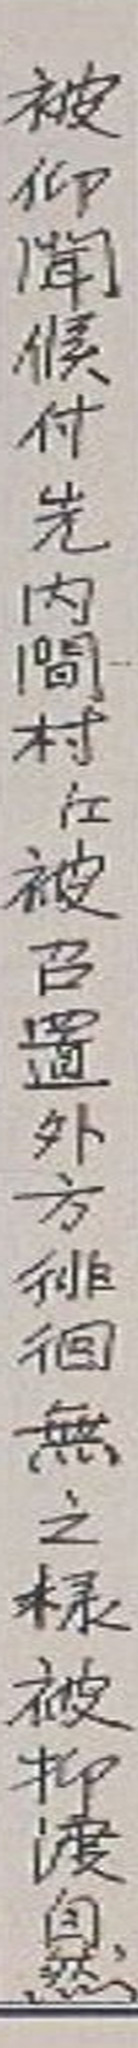被仰聞候付先内間村え被召置外方徘徊無之様被仰渡自然
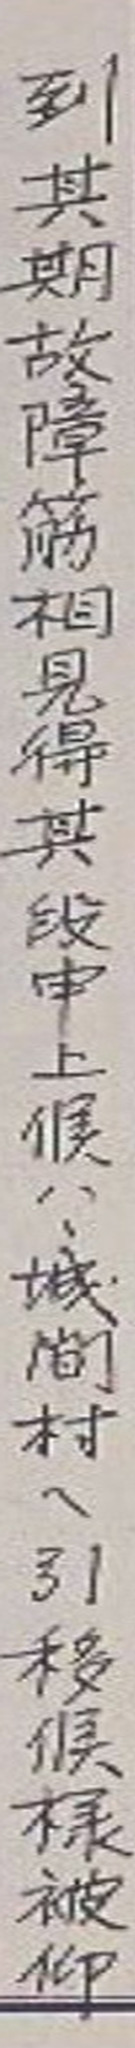到其期故障筋相見得其段申上候はゝ城間村へ引移候様被仰
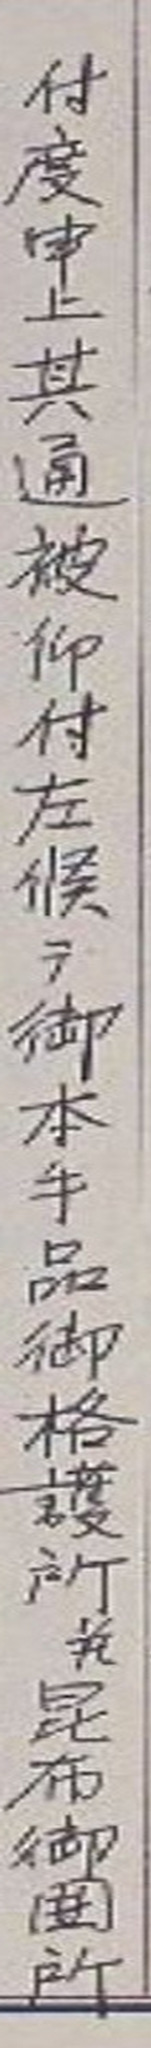付度申上其通被仰付左候て御本手品御格護所并昆布御囲所
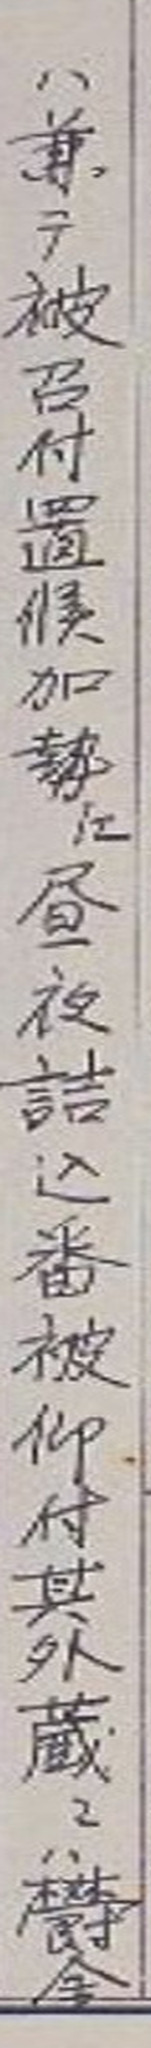は兼て被召付置候加勢え昼夜詰込番被仰付其外蔵々は欝金
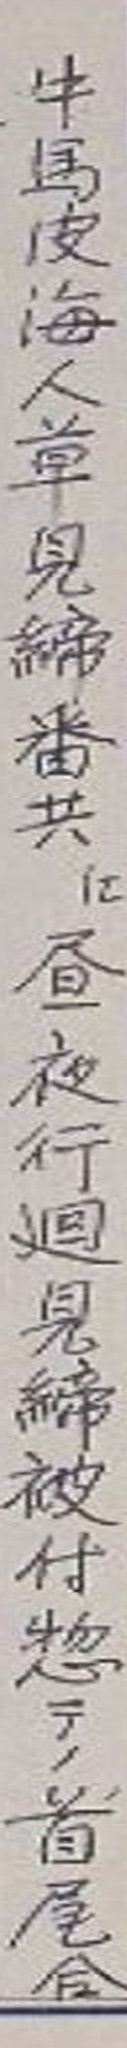牛馬皮海人草見締番共え昼夜行廻見締被付惣ての首尾合
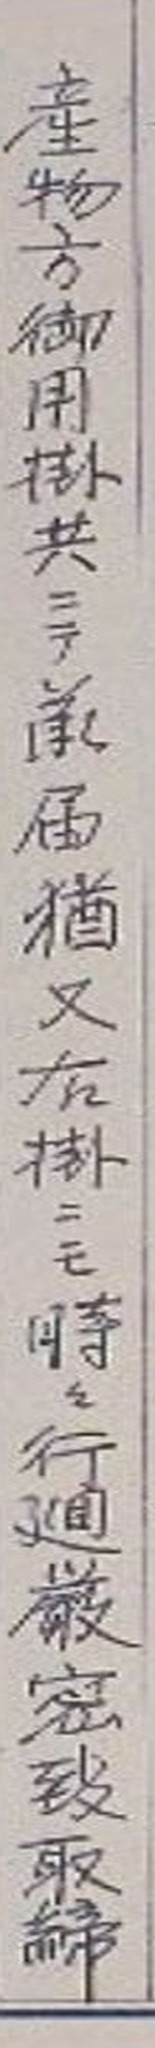産物方御用掛共にて承届猶又右掛にも時々行廻厳密致取締

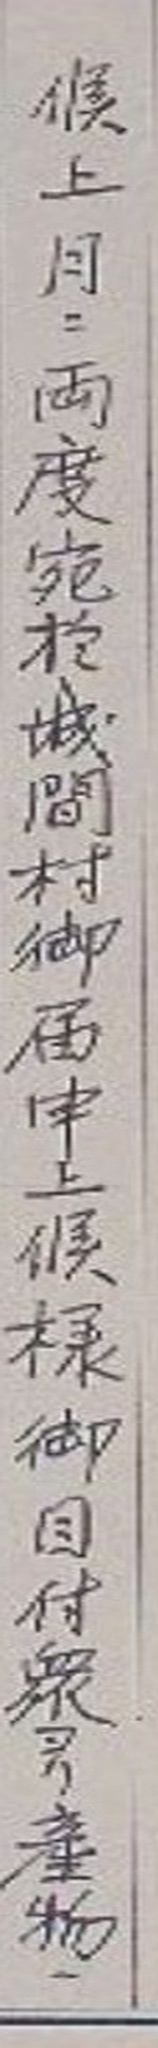候上月に両度宛於城間村御届申上候様御目付衆より産物
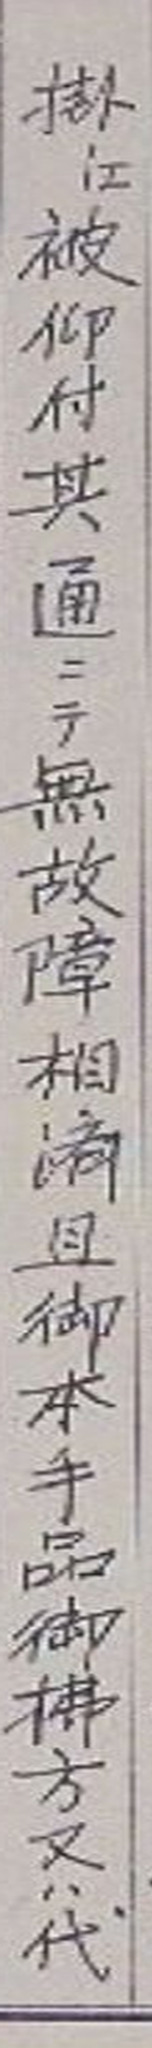掛え被仰付其通にて無故障相済且御本手品御払方又は代
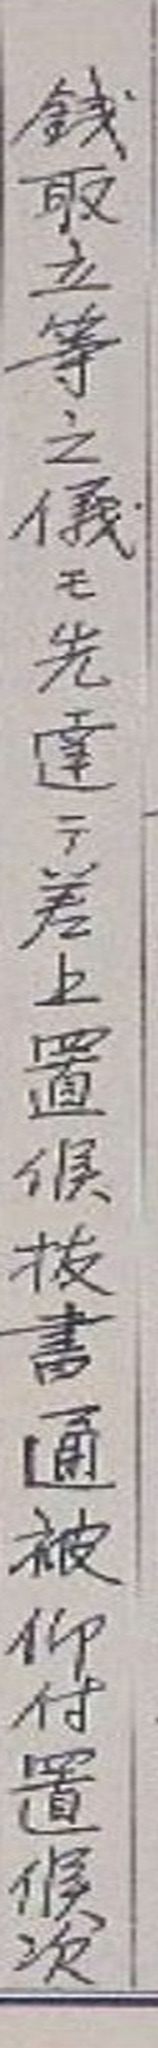銭取立等之儀も先達て差上置候抜書通被仰付置候次
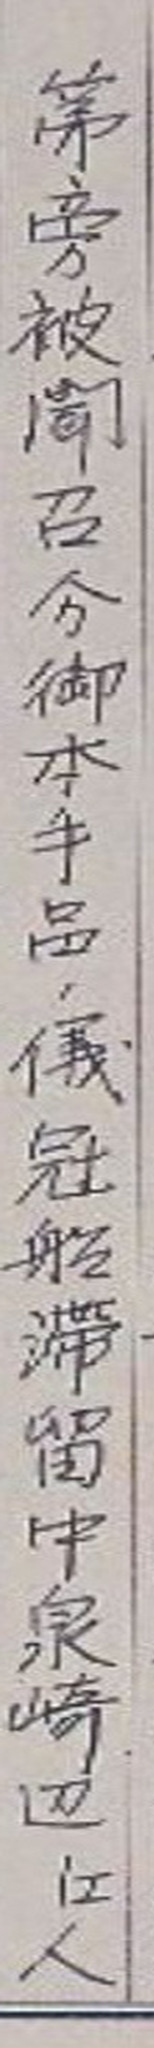第旁被聞召分御本手品の儀冠船滞留中泉崎辺え人
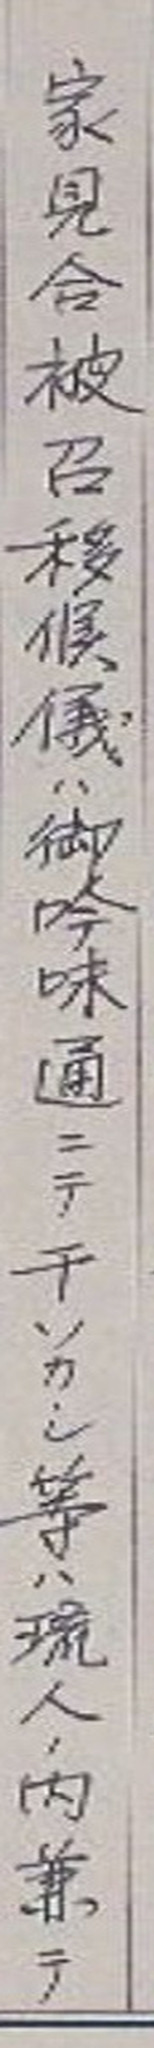家見合被召移候儀は御吟味通にて干そかし等は琉人の内兼て
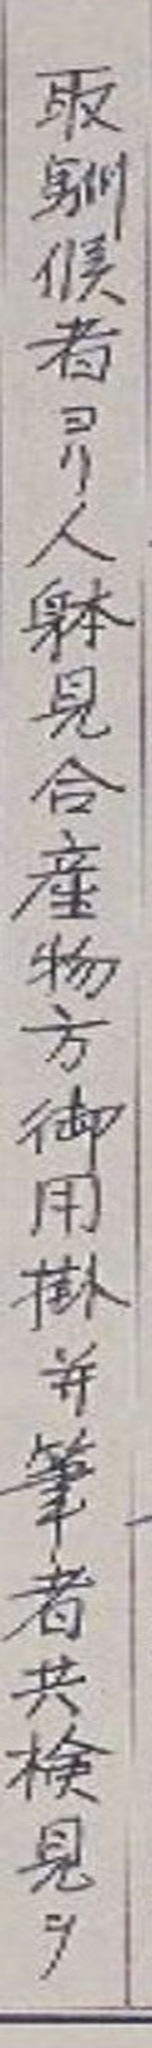取馴候者より人躰見合産物方御用掛并筆者共検見を
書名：支那冊封使来琉諸記 下巻
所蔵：University of the Ryukyus Library
